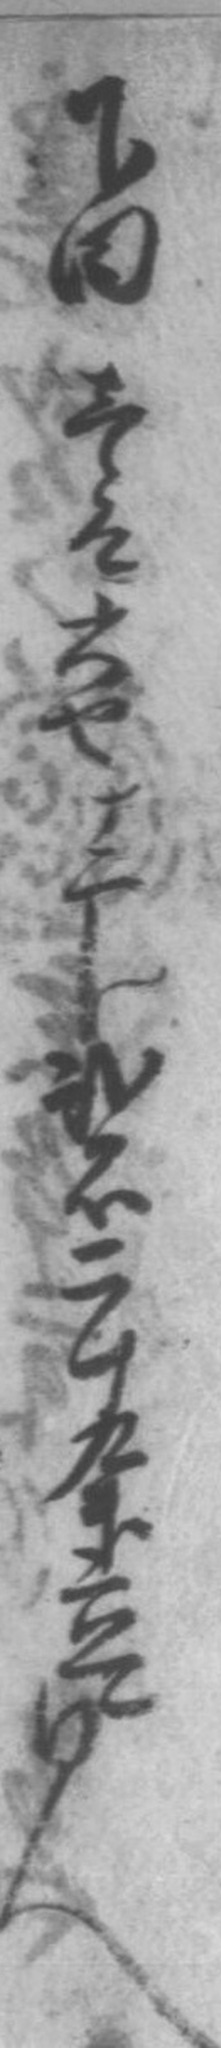下田壱反六せ十二分弐石二斗九升六合同人
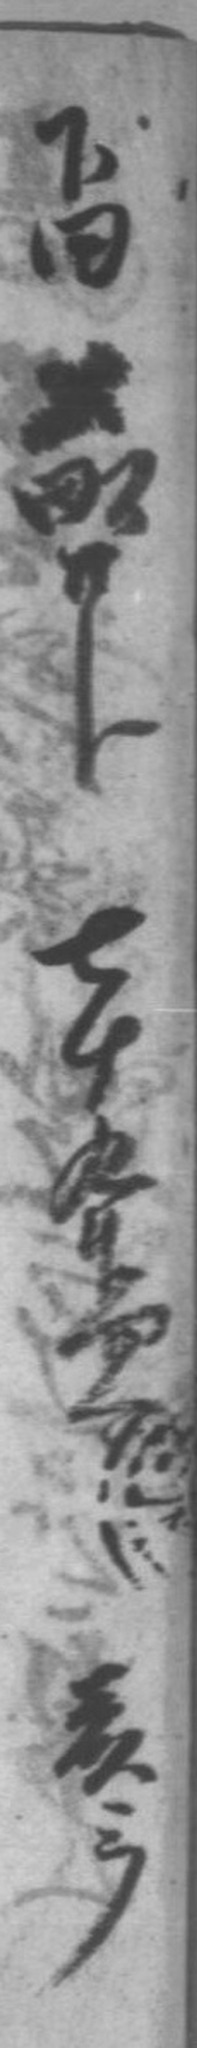下田五畝廿分七斗九升四合彦三郎
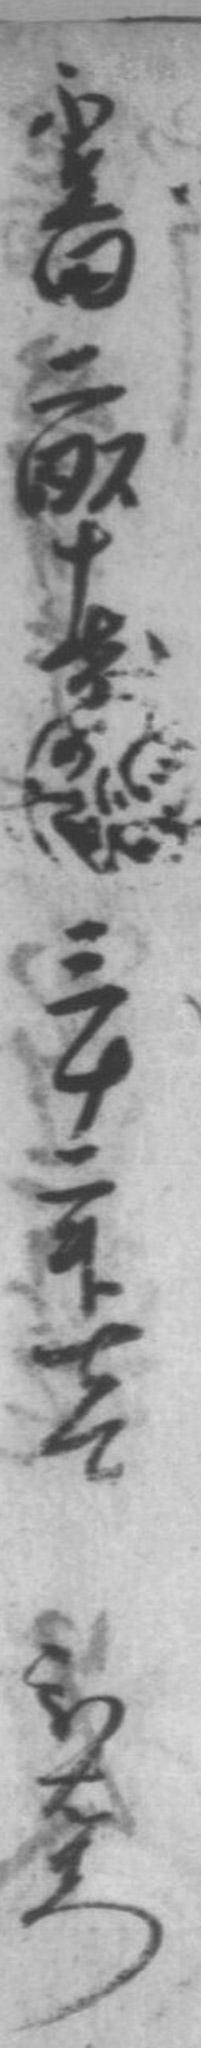不荒田二畝十歩㊞三斗二升七合新右衛門
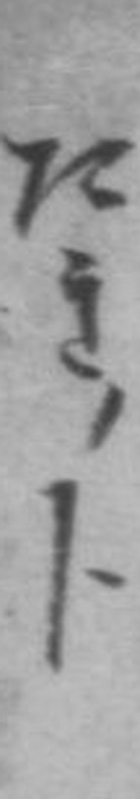たきノ下
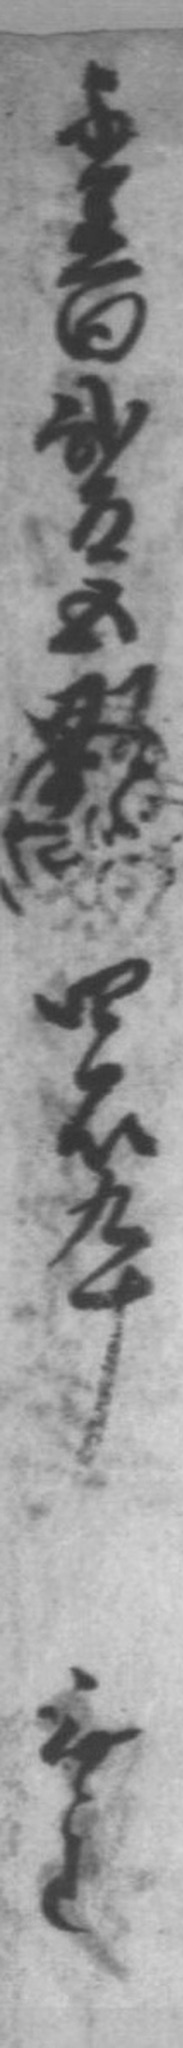不荒田弐反五畝㊞四石九斗無主
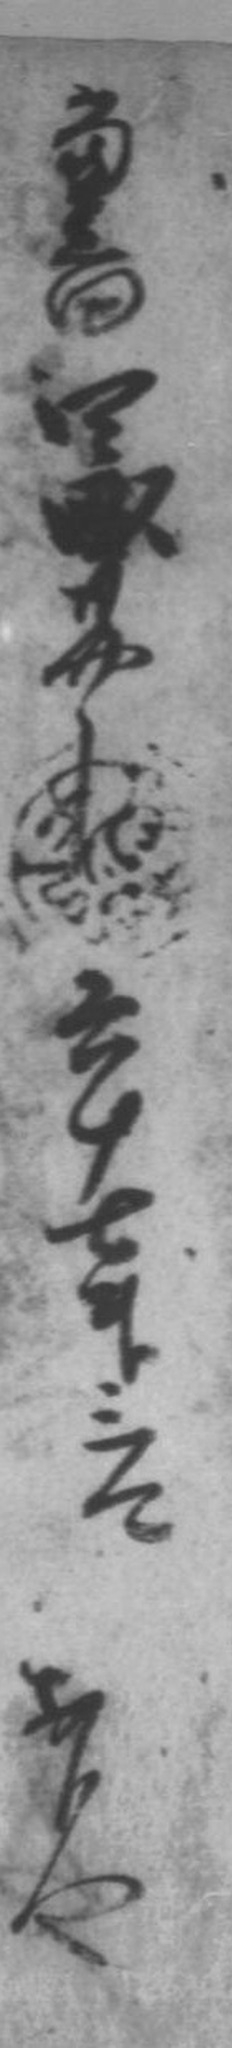当荒田四畝廿四分㊞六斗七升三合おりや
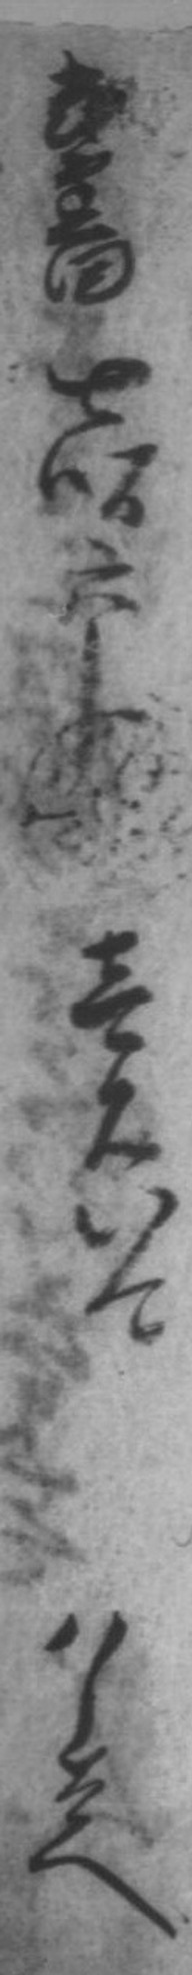当荒田七畝六分㊞壱石八斗八郎兵衛
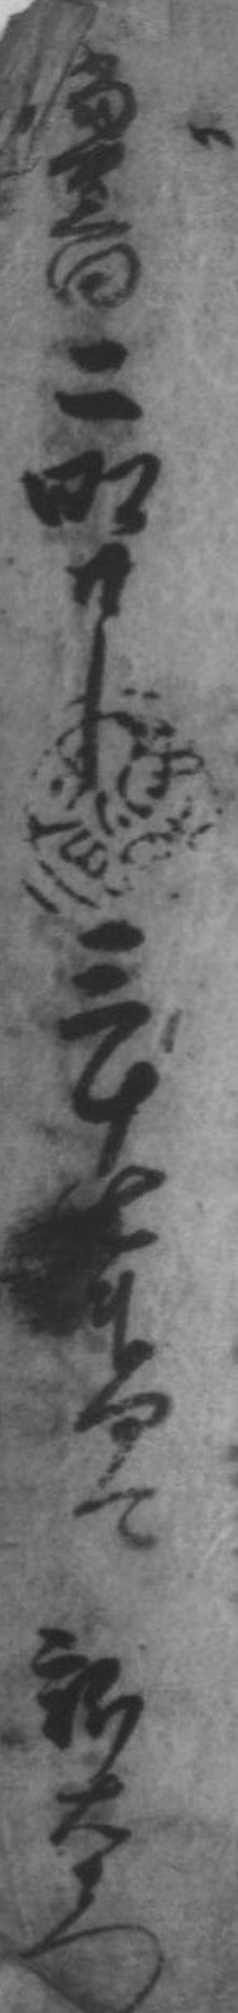当荒田二畝廿分㊞三斗七升四合新右衛門

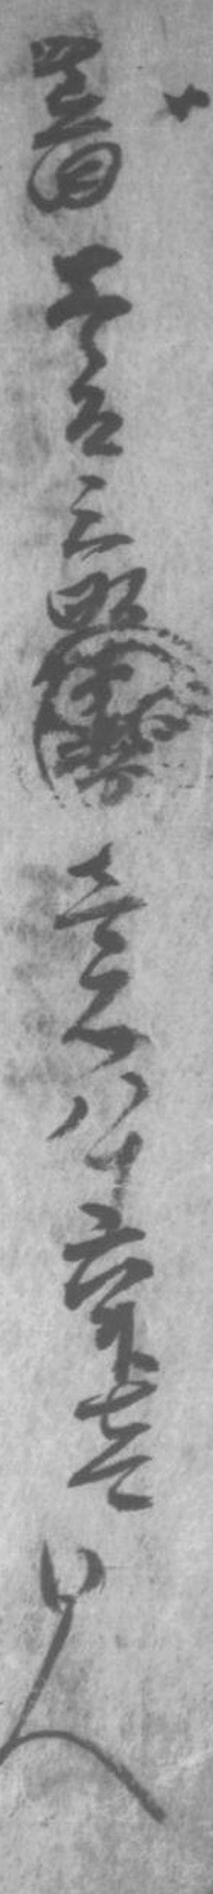荒田壱反三畝㊞壱石八斗六升七合同人
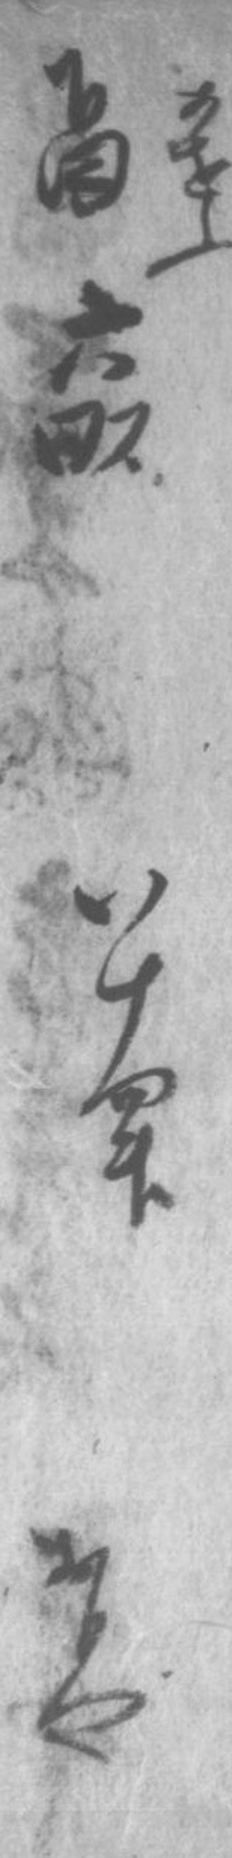下田六畝八斗四升おりや
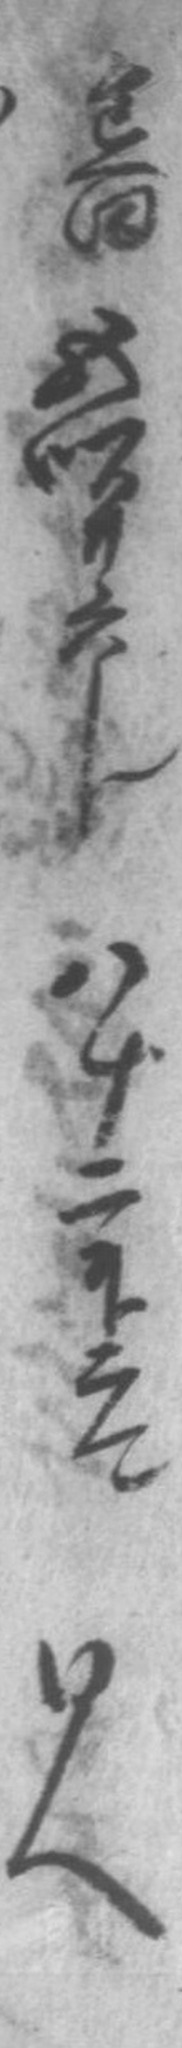荒田五畝廿六分八斗二升二合同人
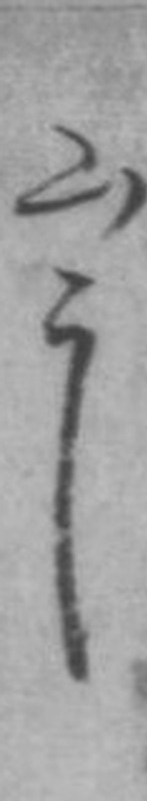山こし
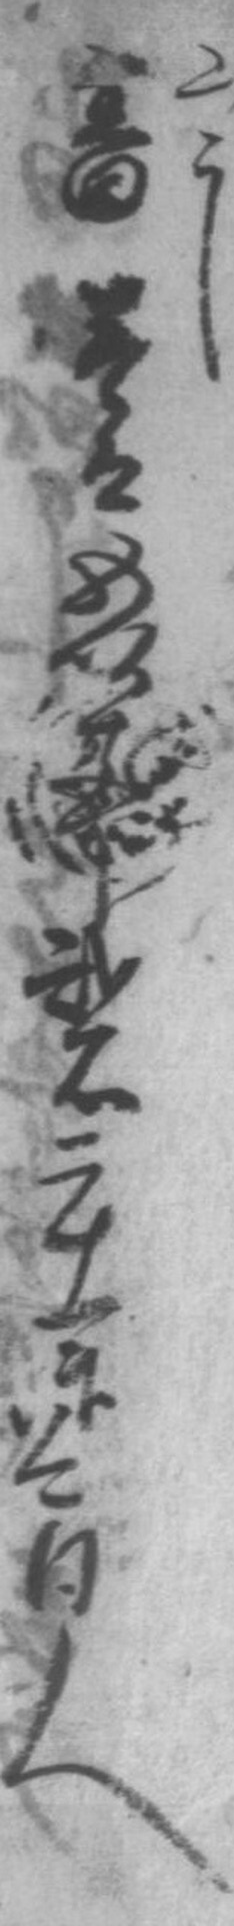荒田壱反五畝廿分㊞弐石二斗一升八合同人
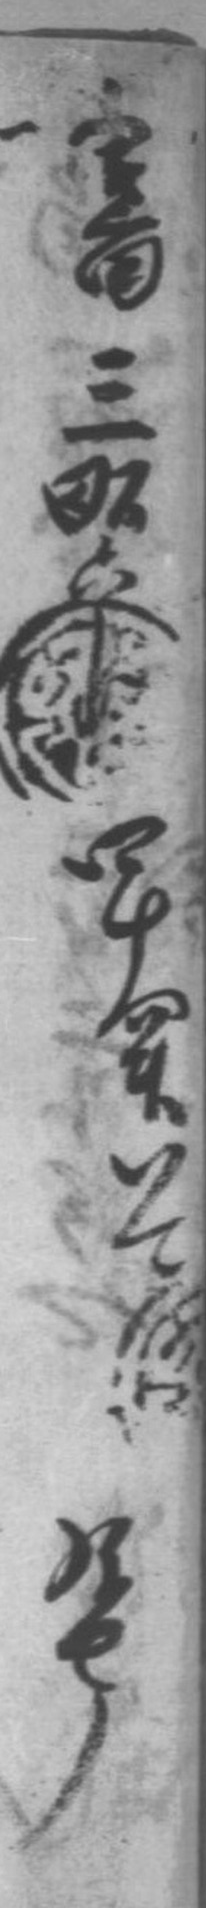荒田三畝六分㊞四斗四升八合弥七郎

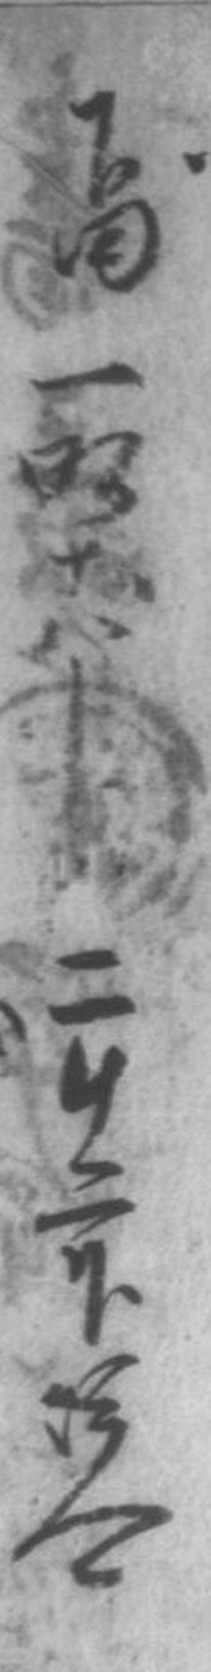下田一畝十八分二斗二升四合同人
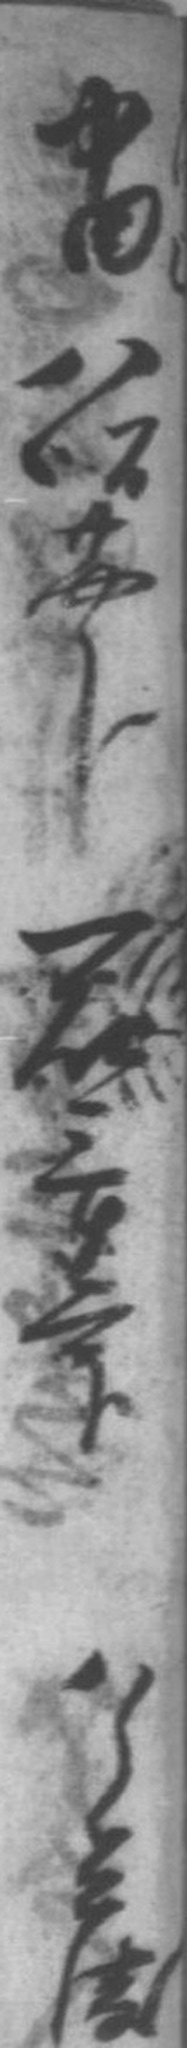中田八畝廿四分一石三斗二升八郎兵衛
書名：越州大野郡ノ内不動堂村御検地帳
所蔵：福井県文書館 Fukui Prefectural Archives
